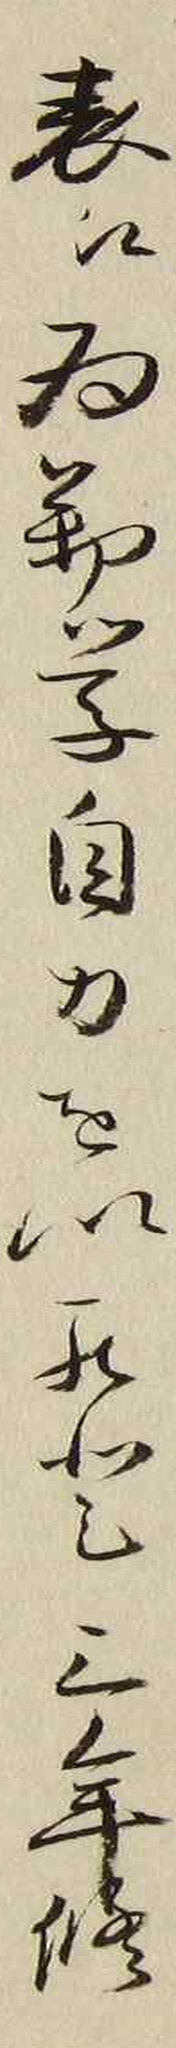表江為勤学万自力を以罷登三年修
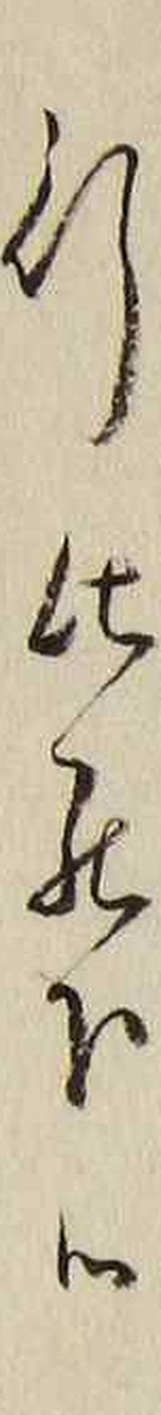行仕罷下候
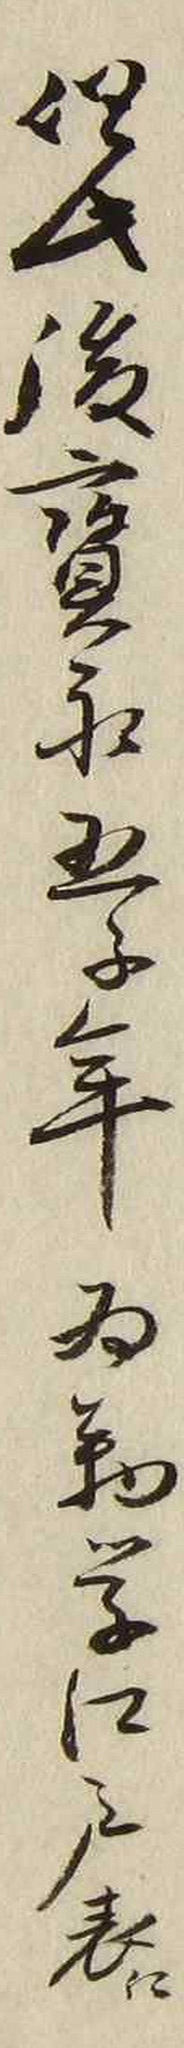但此後宝永五子年為勤学江戸表江

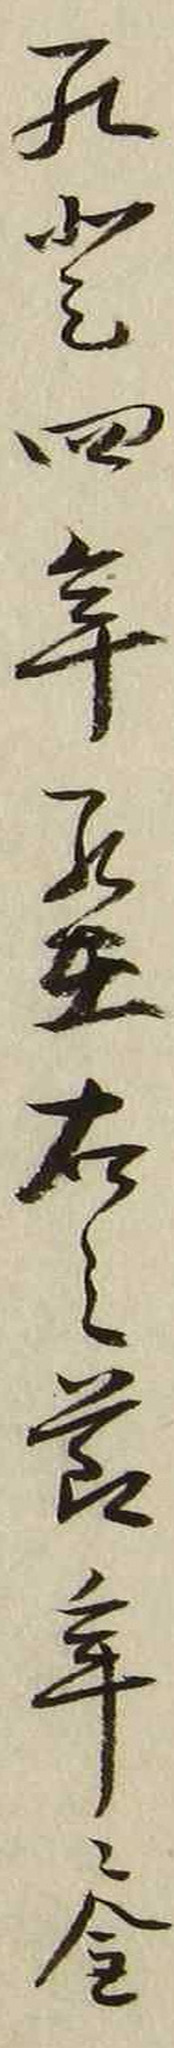罷登四年罷在右之節年々金
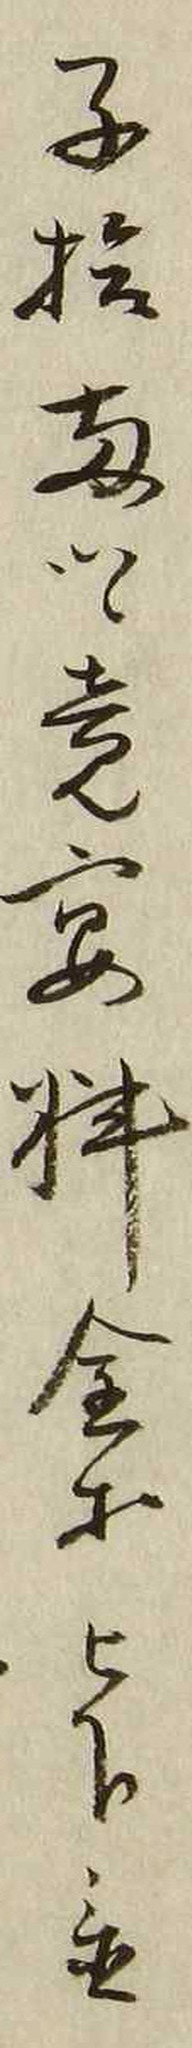子拾両ツヽ竟宴料金等被下置
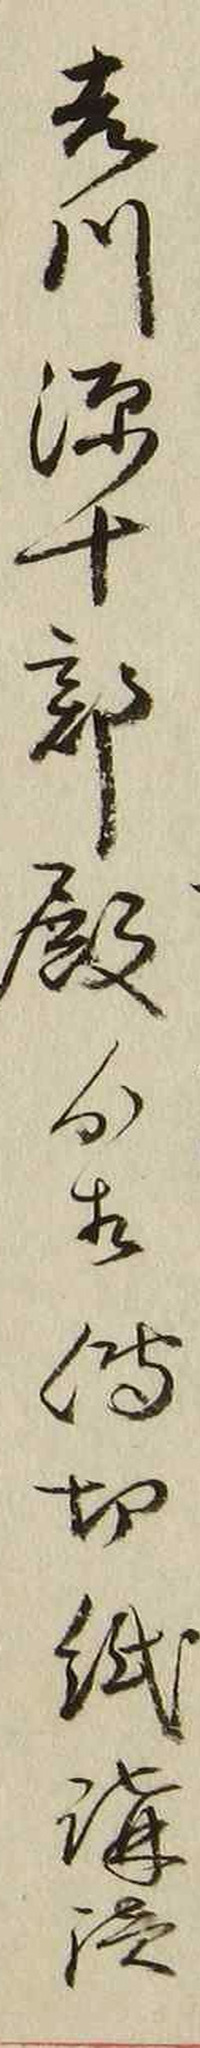吉川源十郎殿ゟ相伝切紙講談
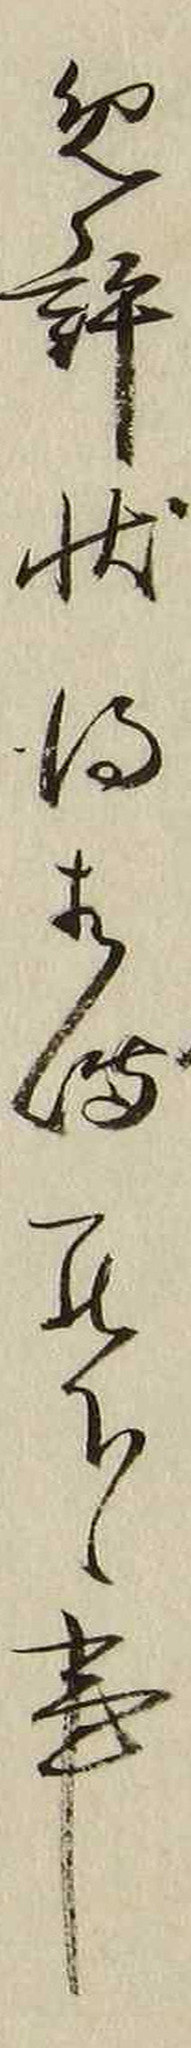免許状得相伝罷下候事
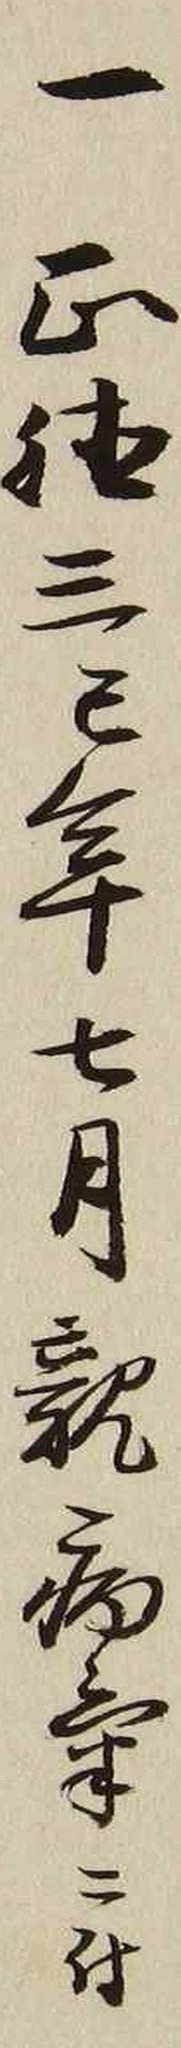一正徳三巳年七月親病気ニ付
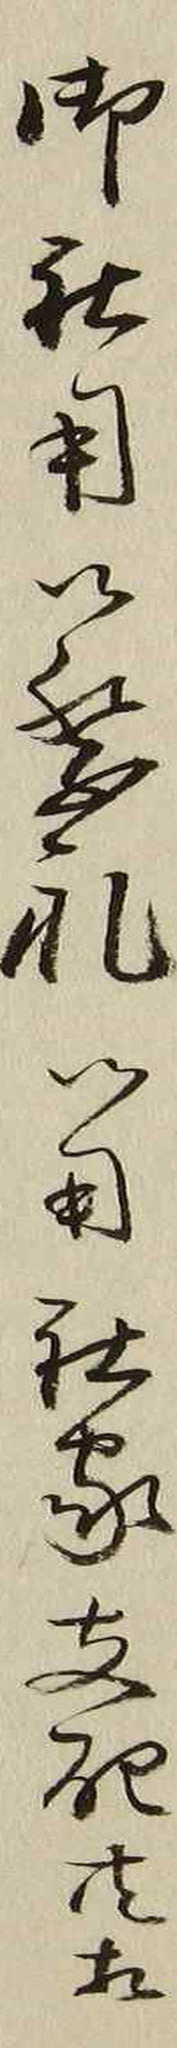御社用御祭礼御用社家支配共相
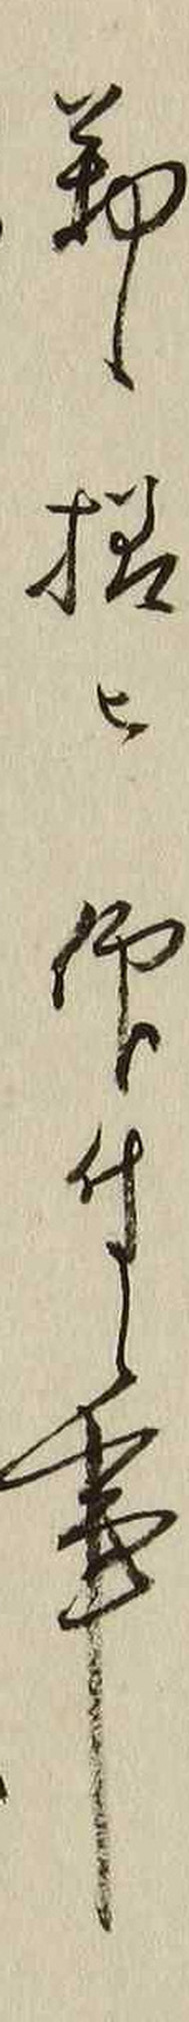勤候様被仰付候事
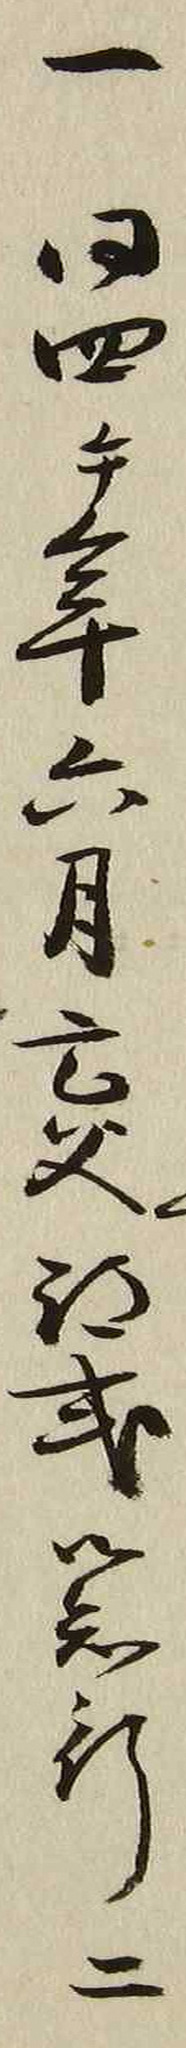一同四午年六月亡父跡式御知行ニ
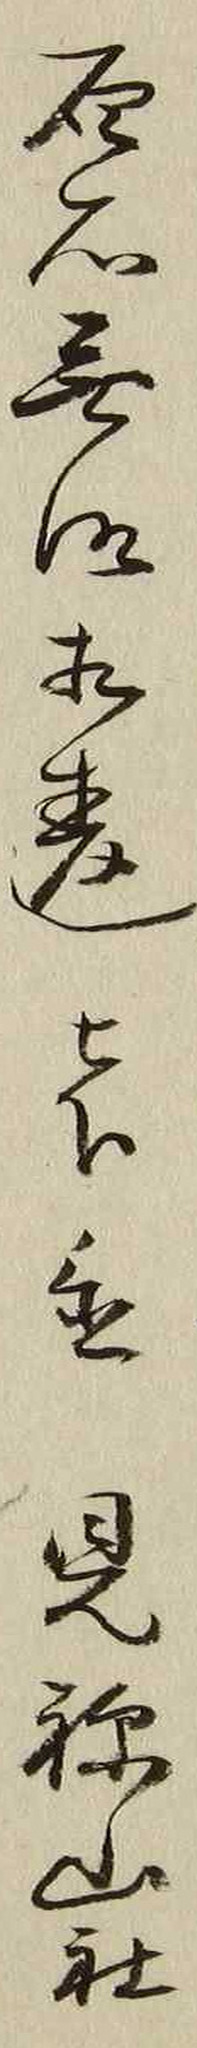百石無御相違被下置見祢山社
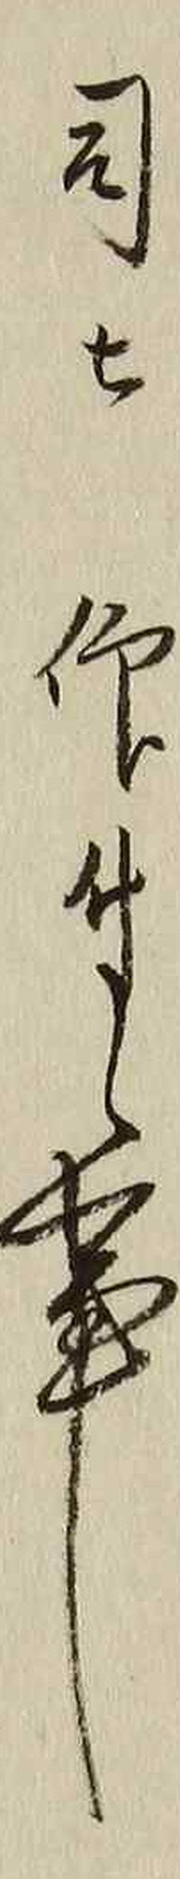司被仰付候事
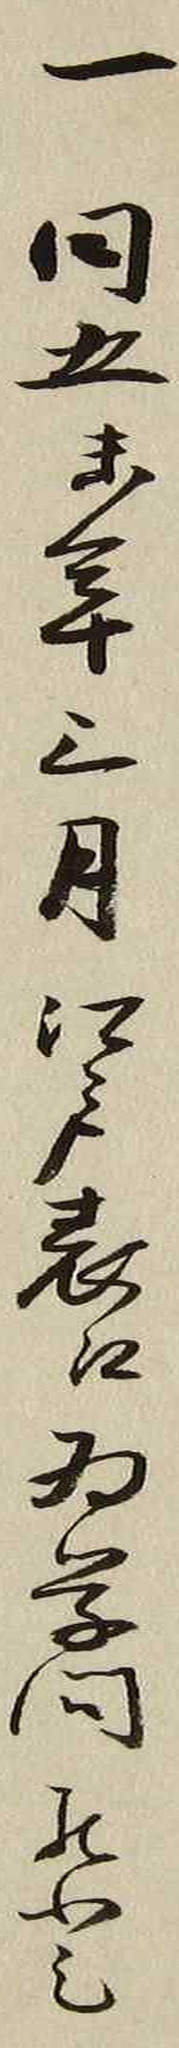一同五未年三月江戸表江為学問罷登
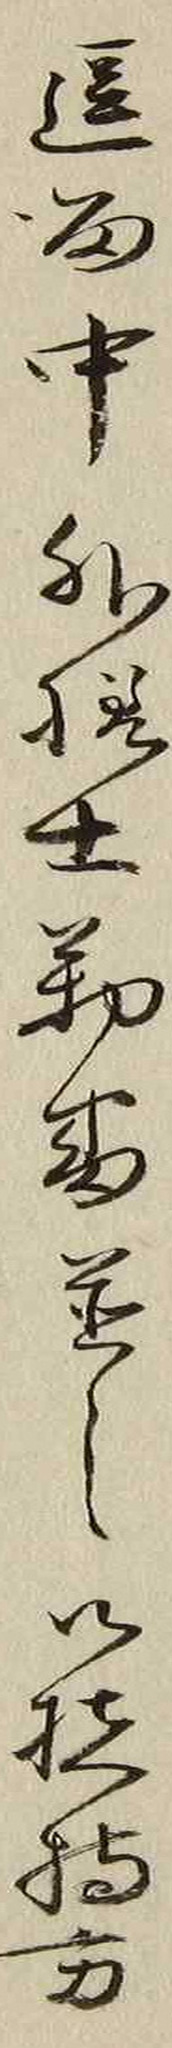逗留中外様士勤番並之扶持方
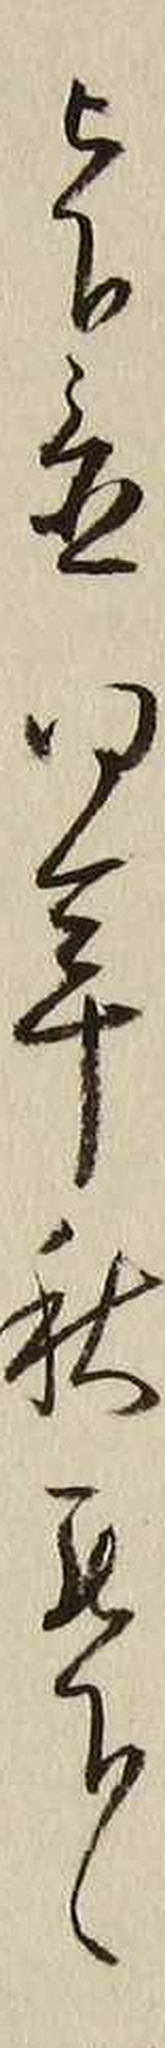被下置同年秋罷下候
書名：諸士系譜　巻之291　さ之部23
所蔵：会津若松市立会津図書館
